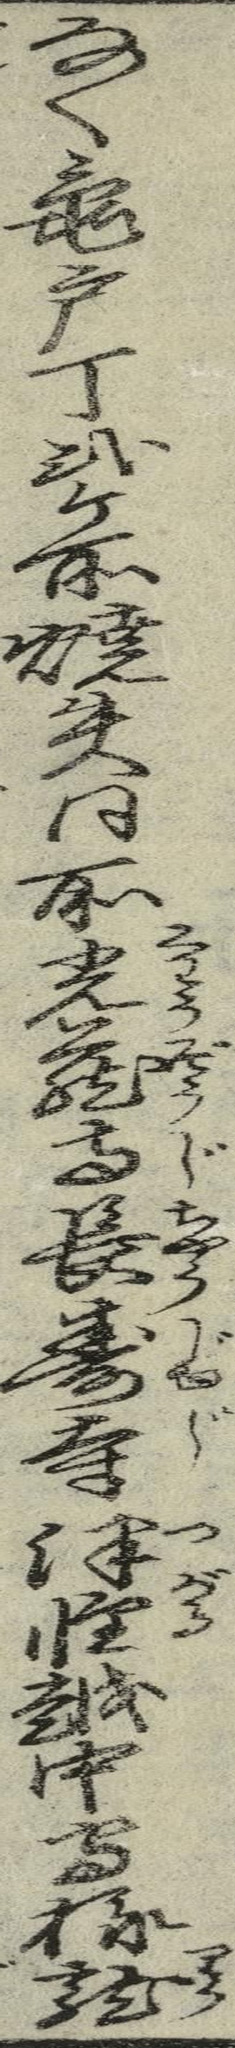なく亀戸丁弐ケ所焼失同所光蔵寺長寿寺津軽越中守様龍
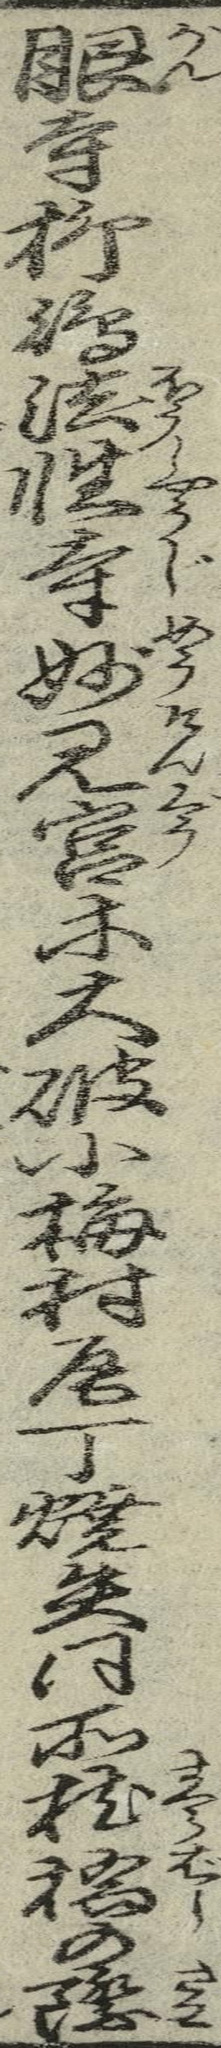眼寺柳嶋法性寺妙見宮等大破小梅村瓦丁焼失同所枕橋の際
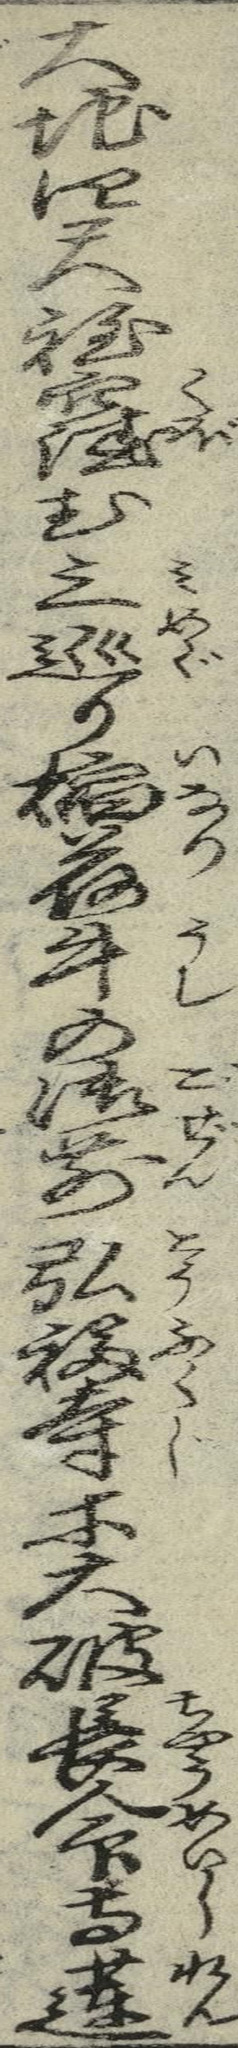大地四尺程窪む三巡り稲荷牛の御前弘福寺等大破長命寺蓮
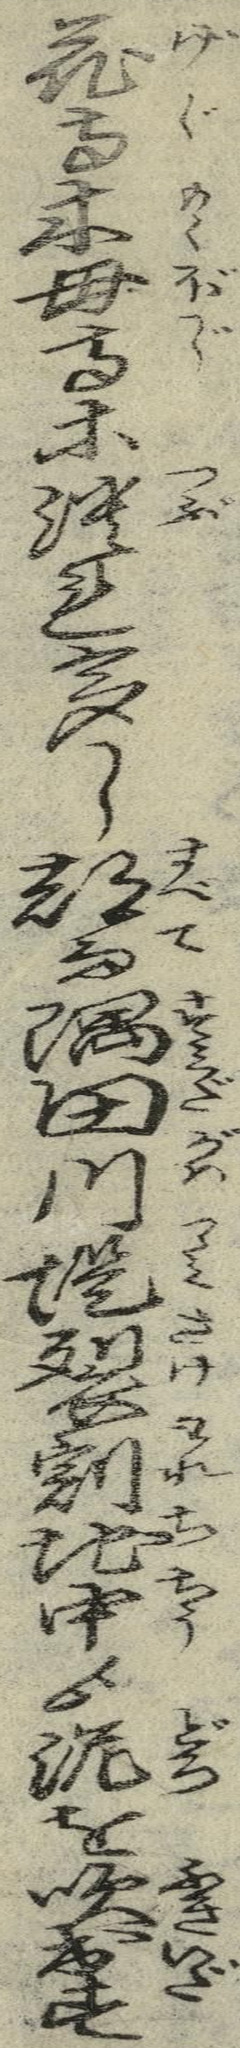花寺木母寺等潰れ多し都而隅田川堤裂割地中ゟ泥を吹出す

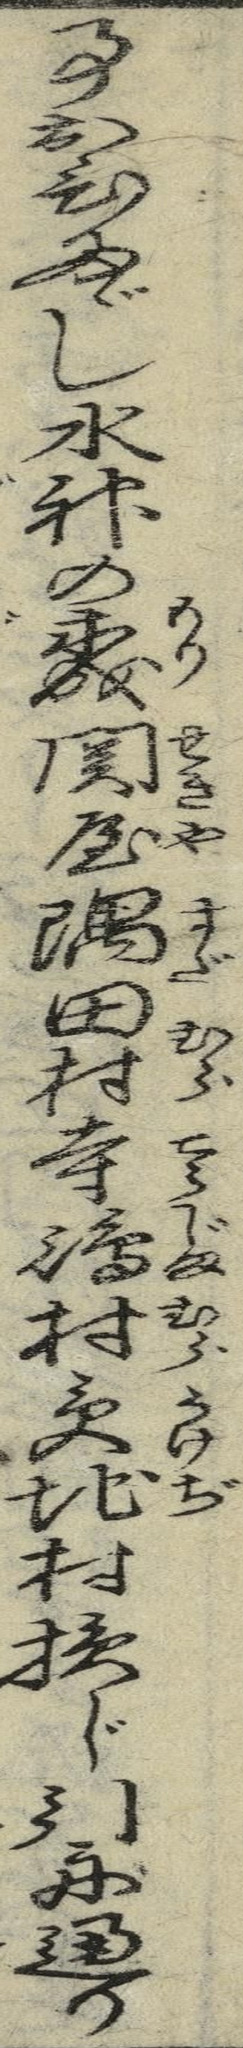事おひたゞし水神の森関屋隅田村寺嶋村受地村損じ引舟通り
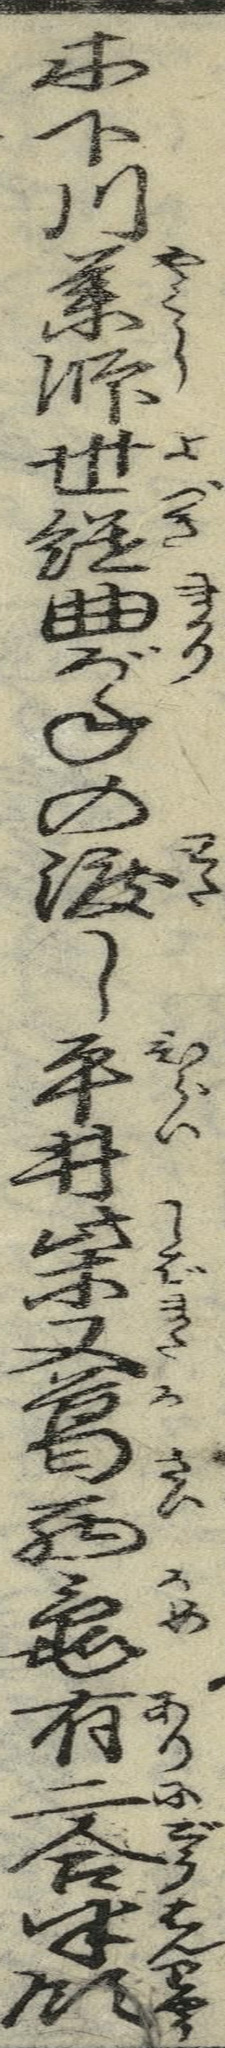等下川薬師世継曲がねの渡し平井柴又葛西亀有二合半領
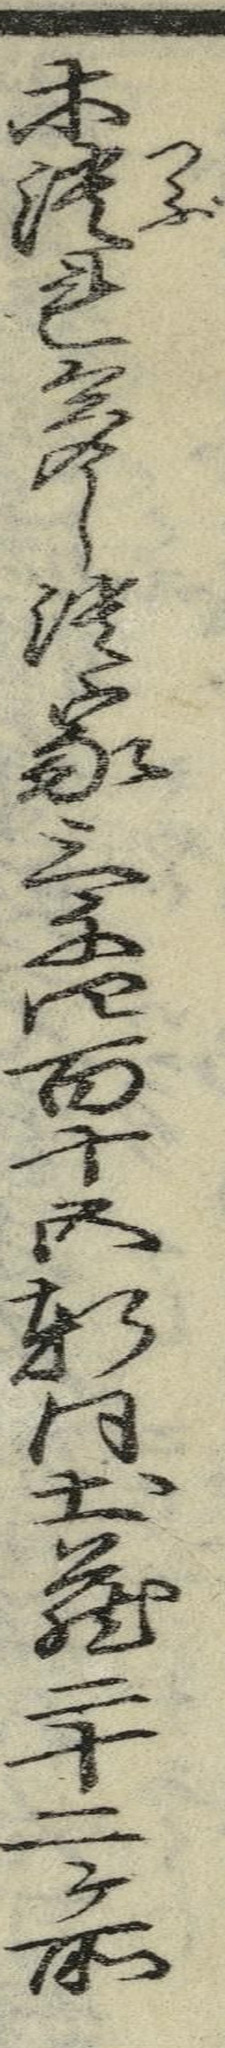等潰れ多し潰家三千四百十五軒同土蔵二十二ケ所
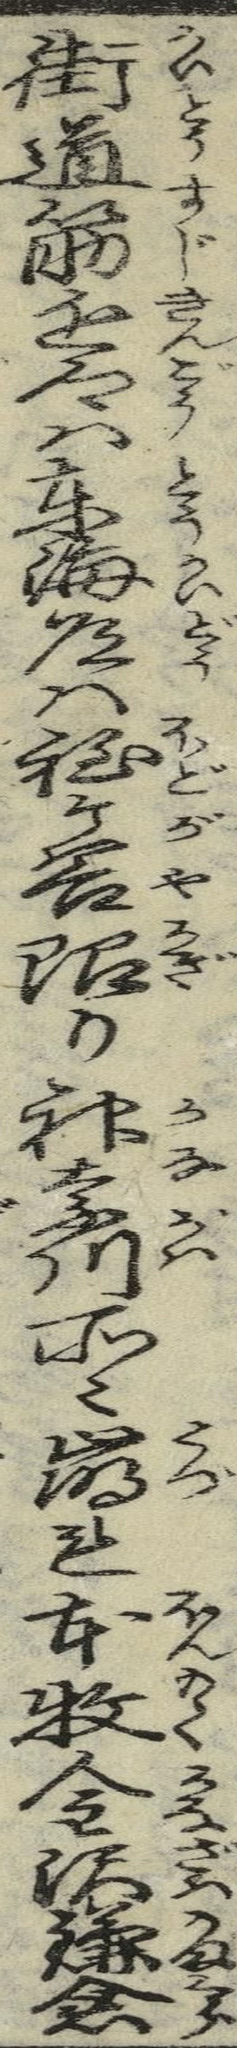街道筋近郷は東海道は程ヶ谷限り神奈川所々崩れ本牧金沢鎌倉
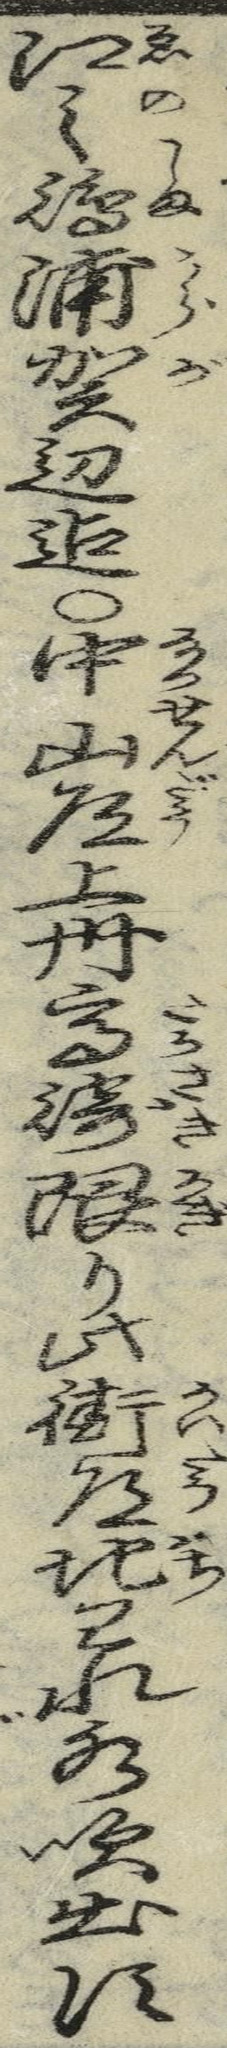江之嶋浦賀辺迄〇中山道上州高崎限り此街道地われ水吹出す
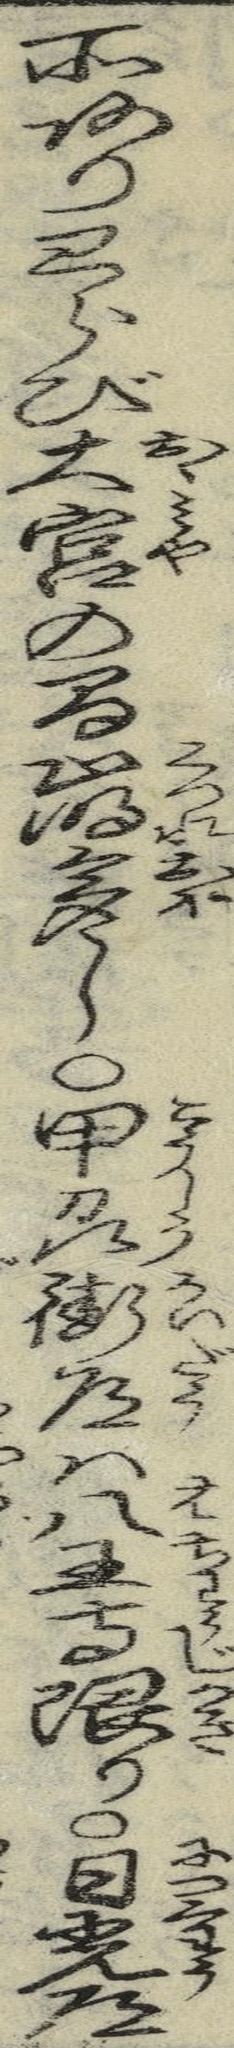所ありわらび大宮の間崩多し〇甲州街道は八王寺限り〇日光道
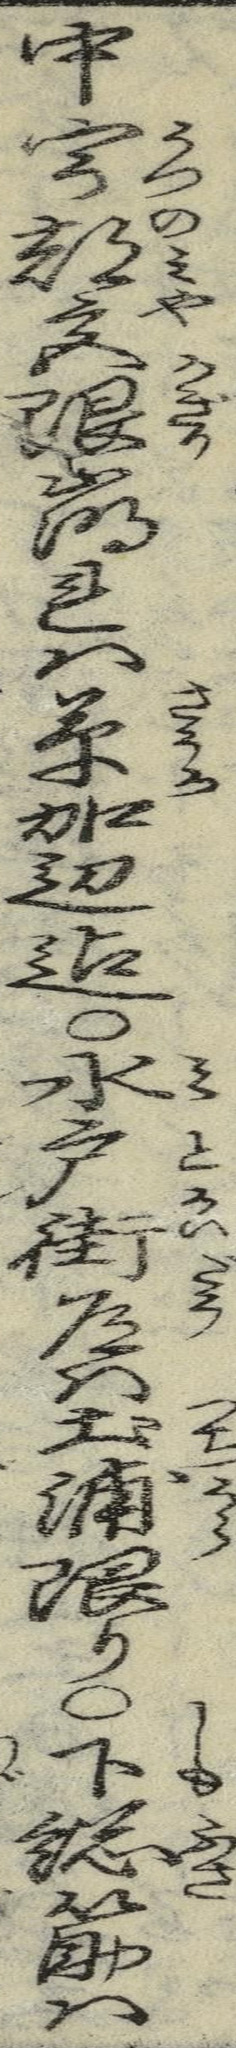中宇都宮限崩れは草加辺迄〇水戸街道は土浦限り〇下総筋は
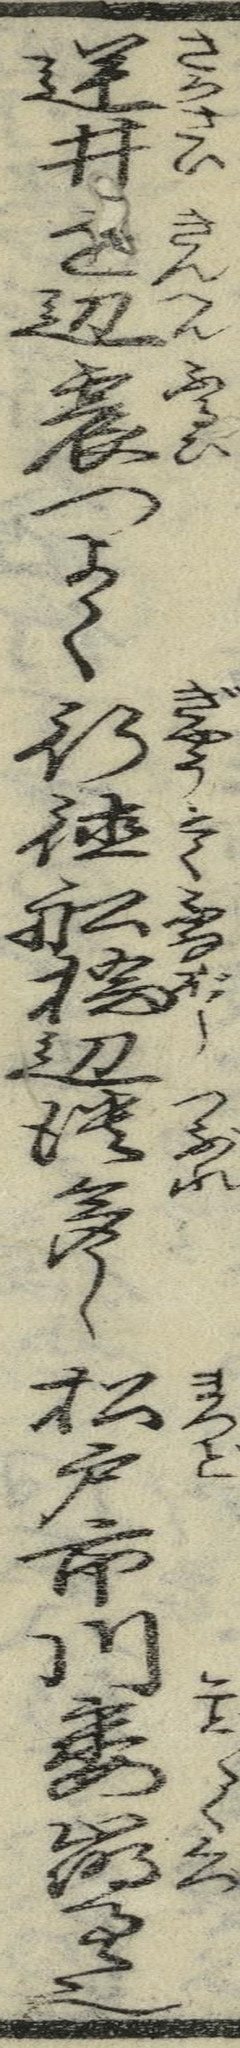逆井近辺震つよく行徳舩橋辺潰多し松戸市川悉崩るゝ也
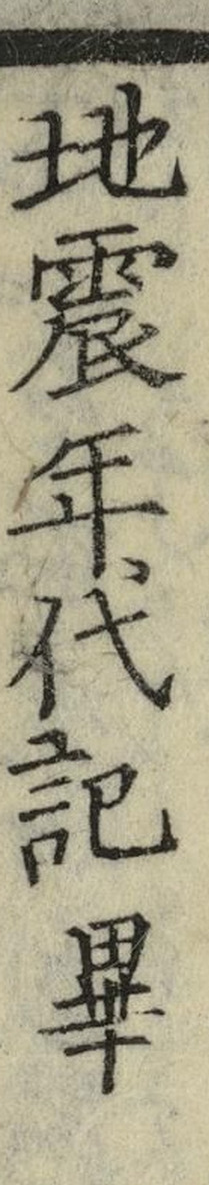地震年代記畢
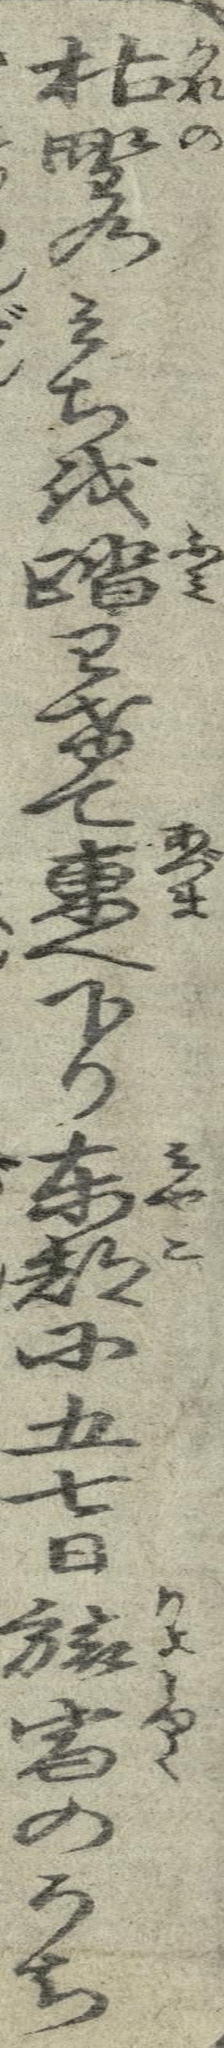枯野のみちを踏わけて東へ下り東都に五七日旅宿のうち
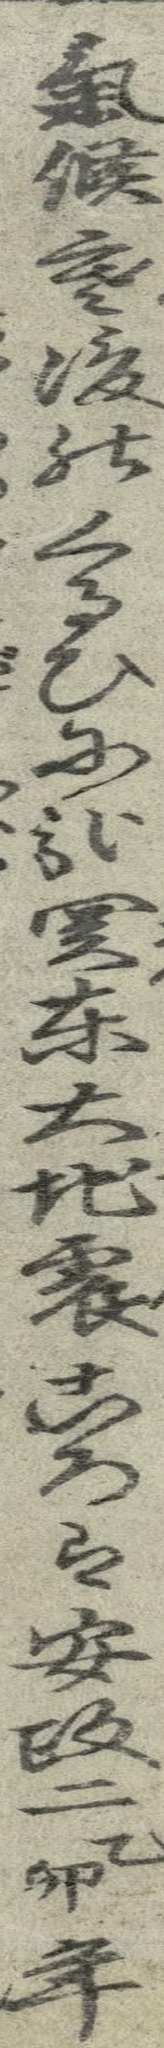気候寒暖のくるひに哉関東大地震ころは安政二乙卯年
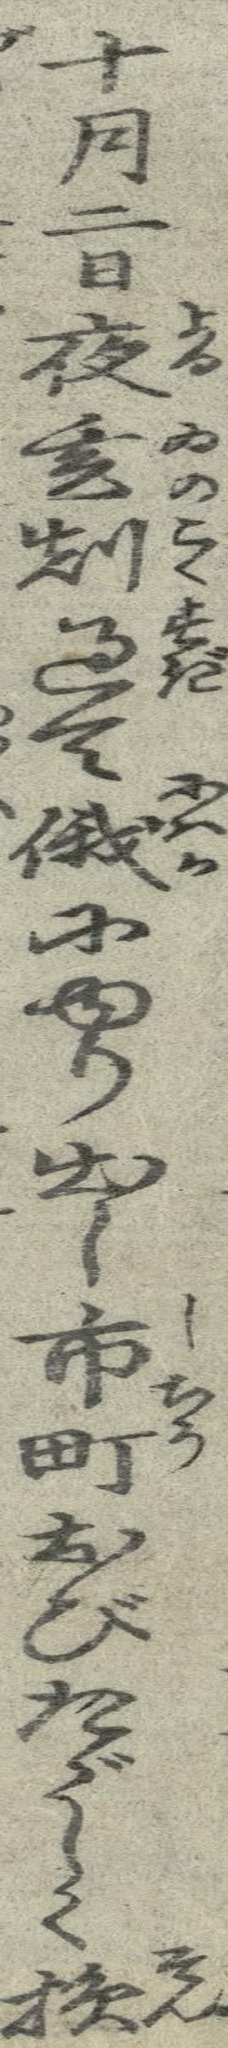十月二日夜亥刻過て俄にゆり出し市町おびたゞしく損
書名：地震年代記
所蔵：東京大学地震研究所図書室 Earthquake Research Institute Library, The University of Tokyo, JAPAN
